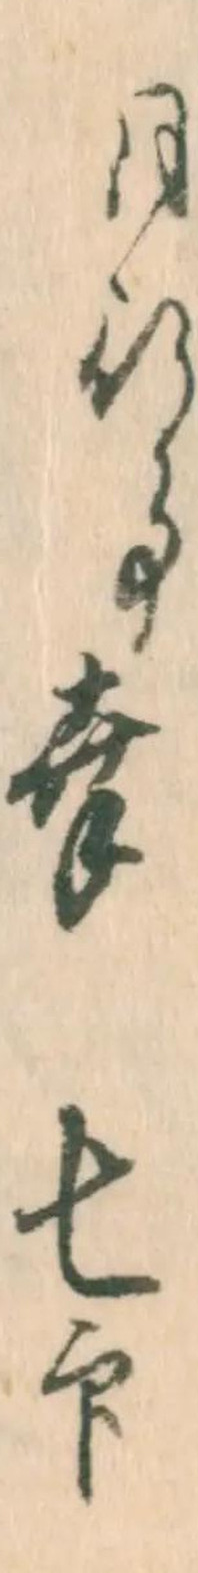月行事幸七印
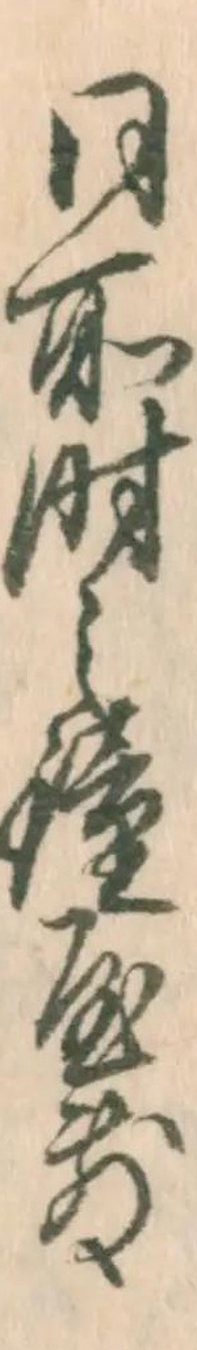同所時之鐘屋敷
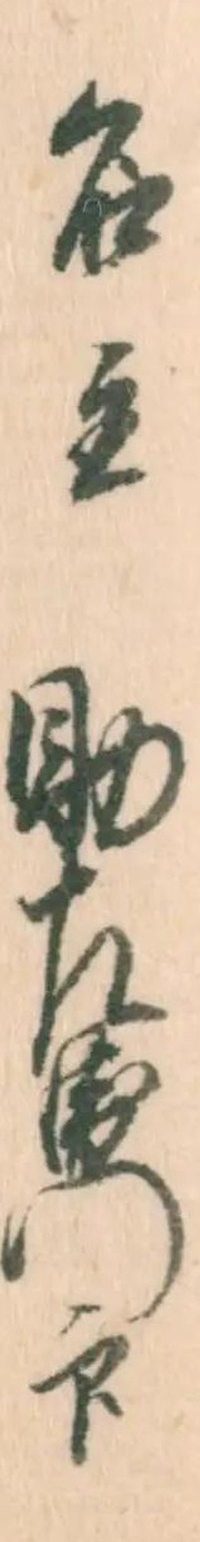名主助左衛門印
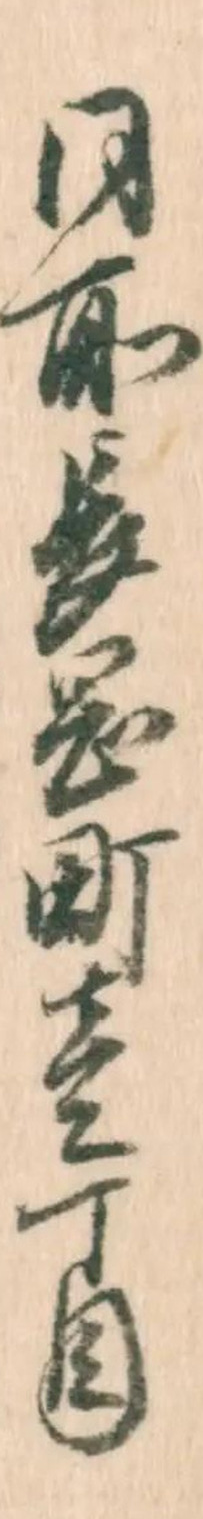同所長岡町壱丁目
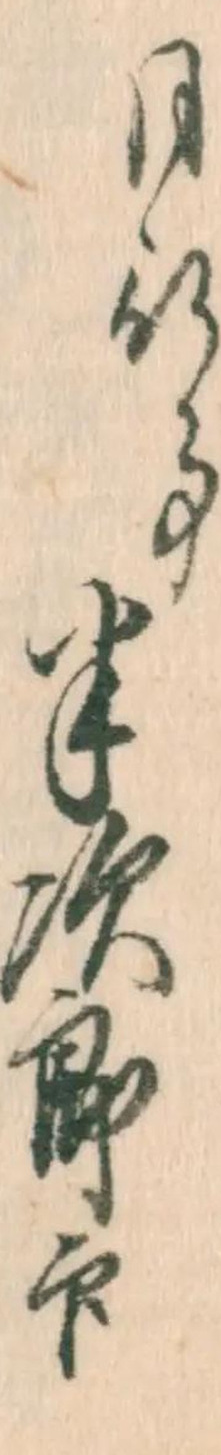月行事半次郎印
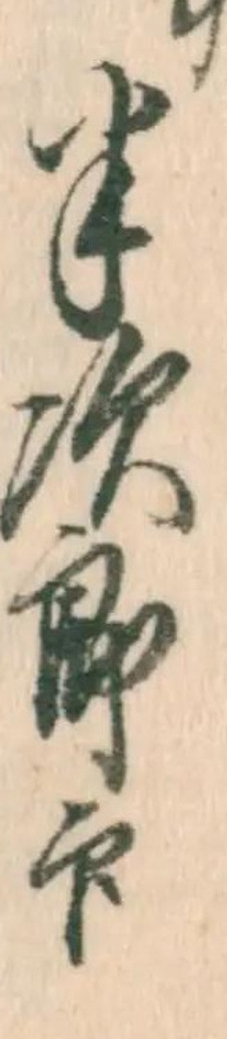月行事半次郎印
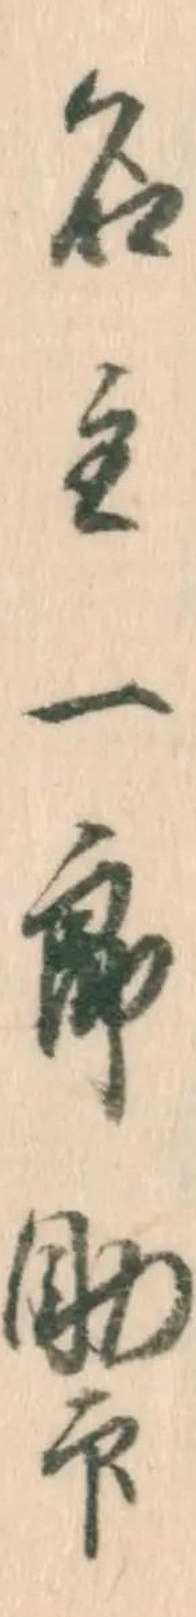名主一郎助印
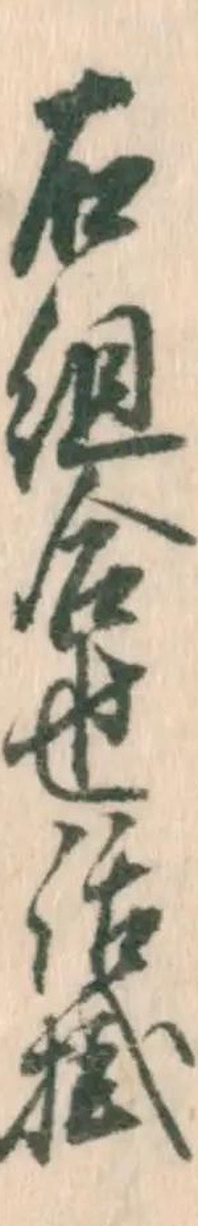右組合世話掛
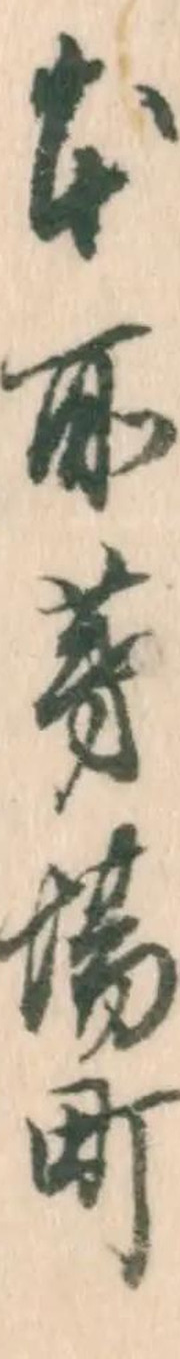本所茅場町
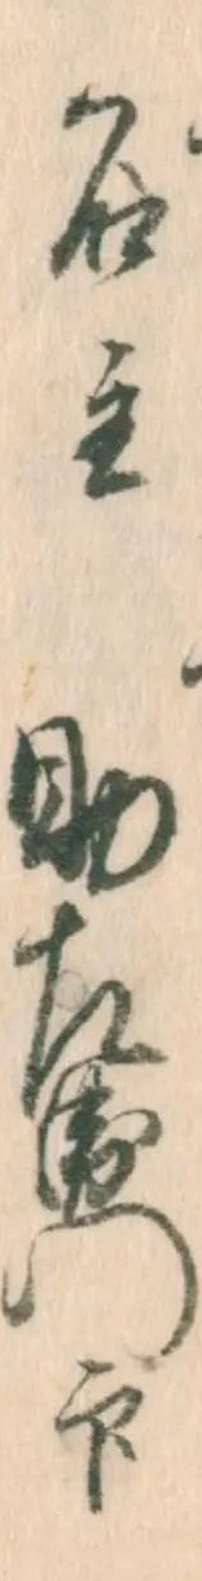名主助左衛門印
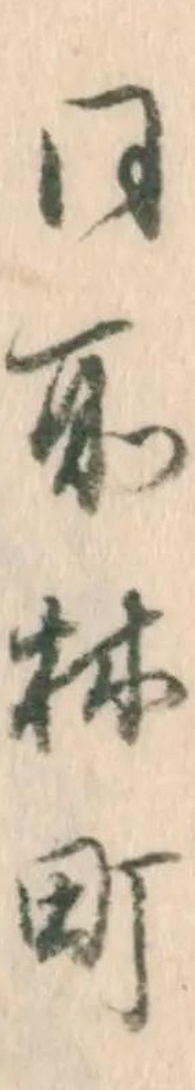同所林町
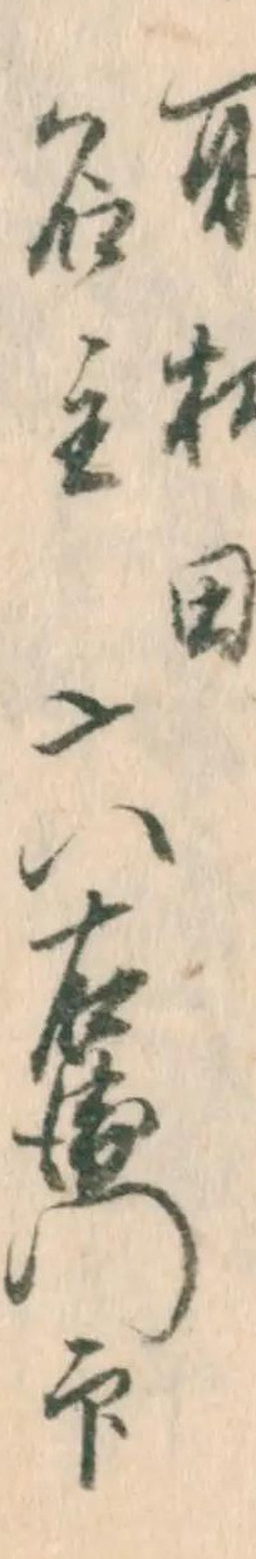名主六右衛門印
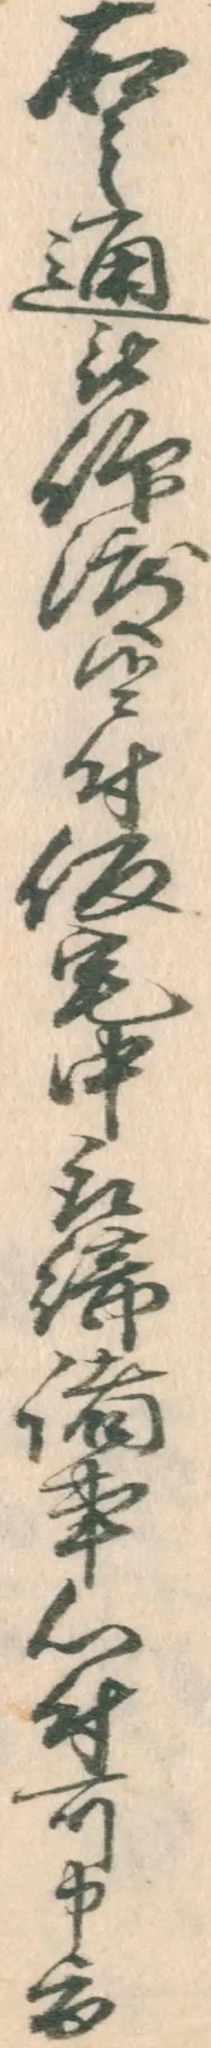右之通被仰渡候ニ付仮宅中取締諸事心付可申旨
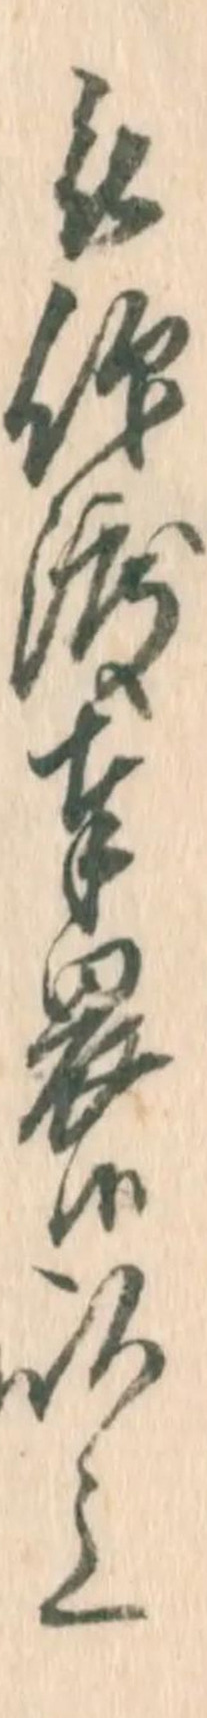被仰渡奉畏候以上

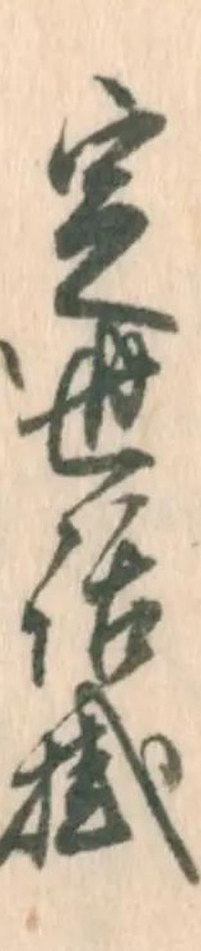定世話掛
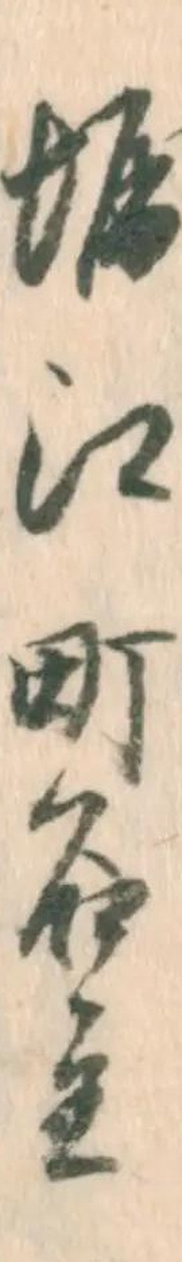堀江町名主
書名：地震災書留 2巻. [2] 内表紙に「地震一件　安政二卯年十月」とあり
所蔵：国立国会図書館 National Diet Library, JAPAN
